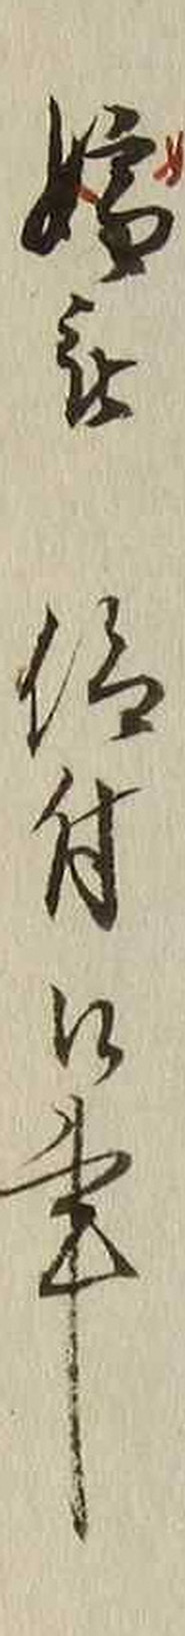嫡被仰付候事
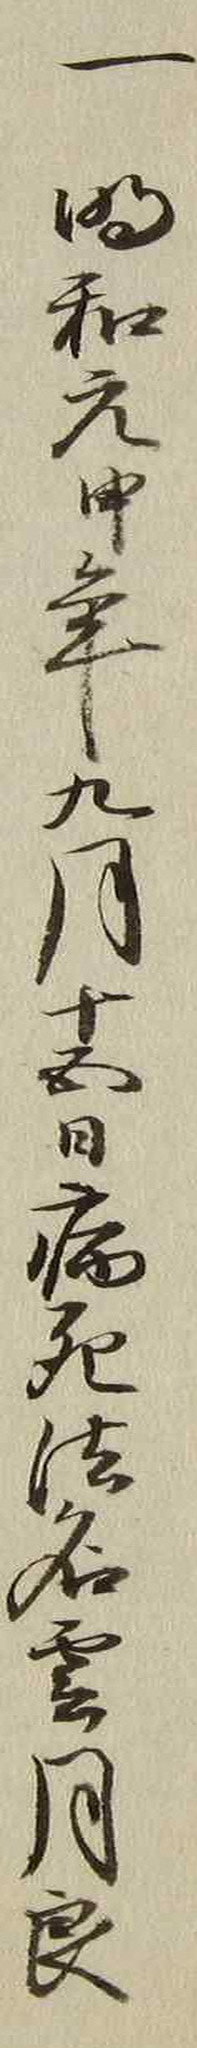一明和元申年九月十五日病死法名雲月良
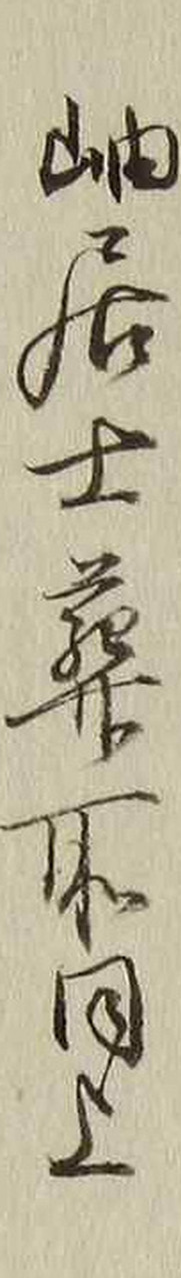岫居士葬所同上
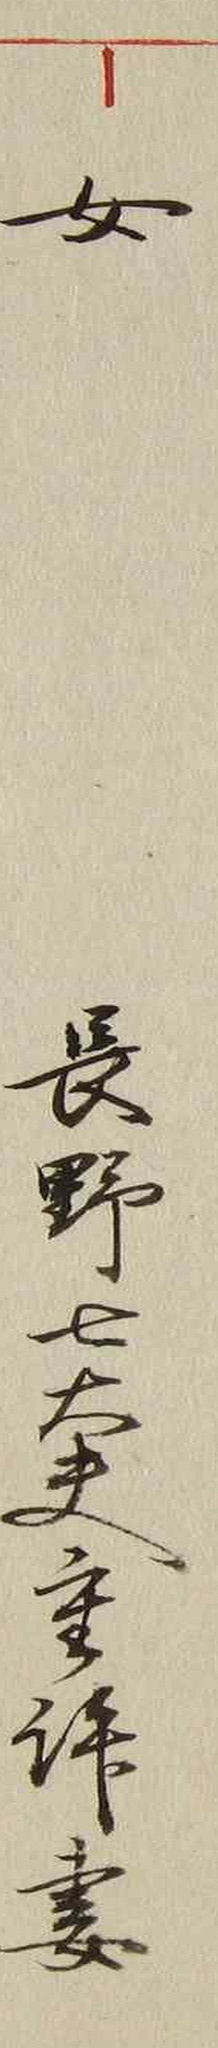女長野七太夫重許妻
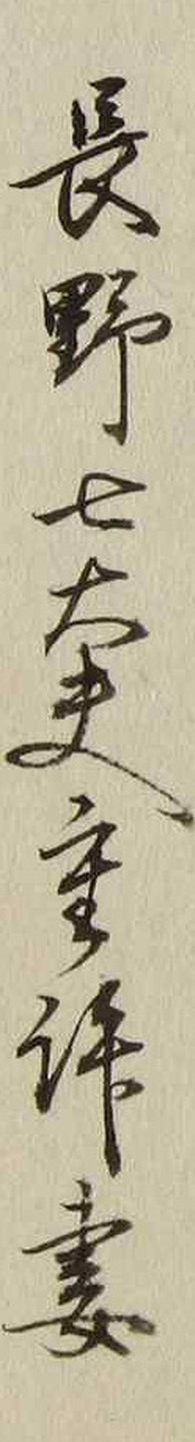女長野七太夫重許妻
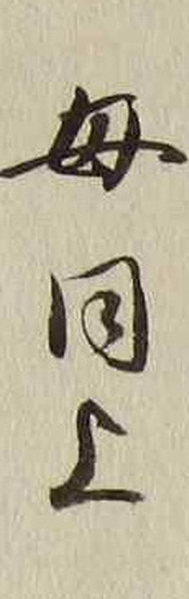母同上
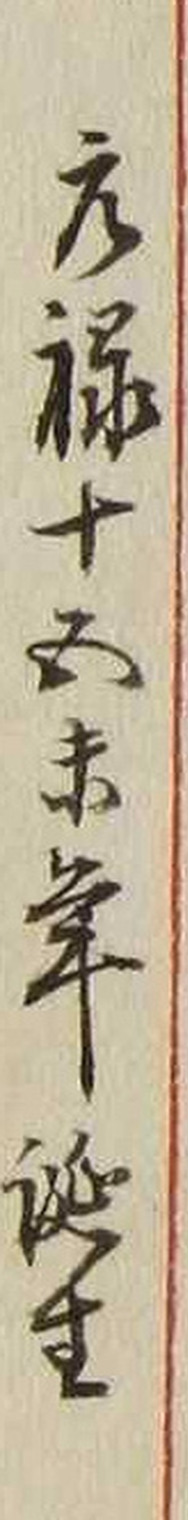元禄十五年誕生
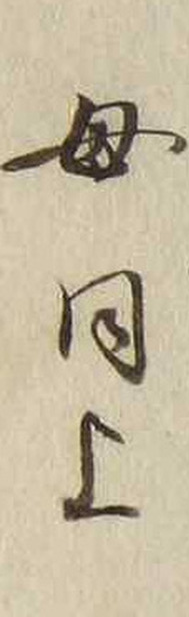母同上

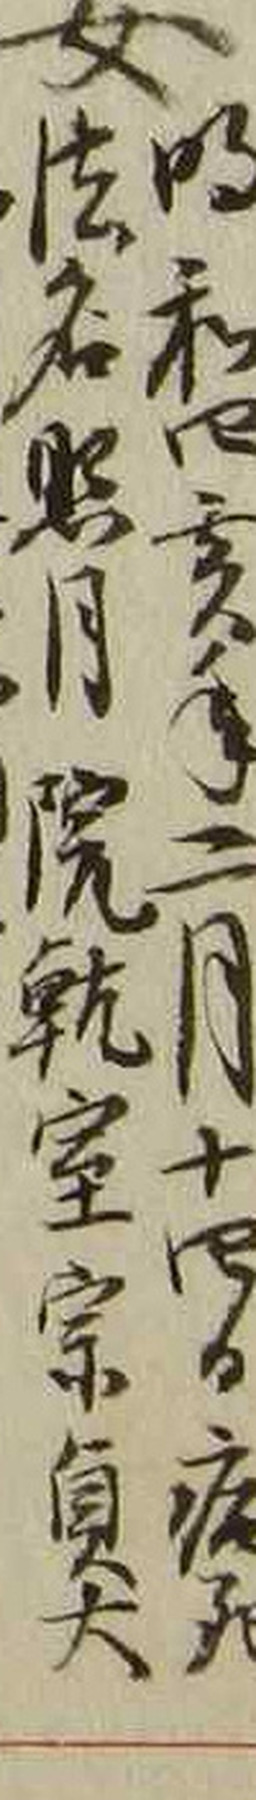法名照月院乾室宗貞大
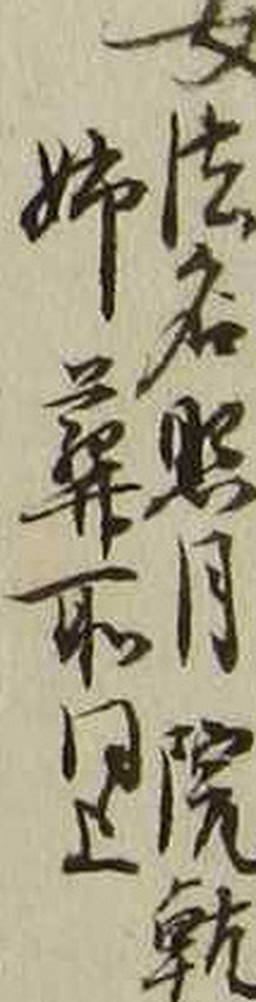姉葬所同上
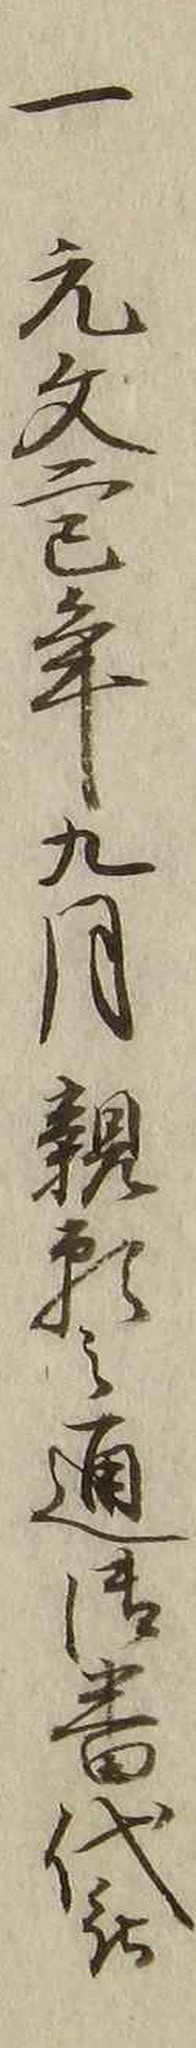一元文二巳年九月親願之通御番代被
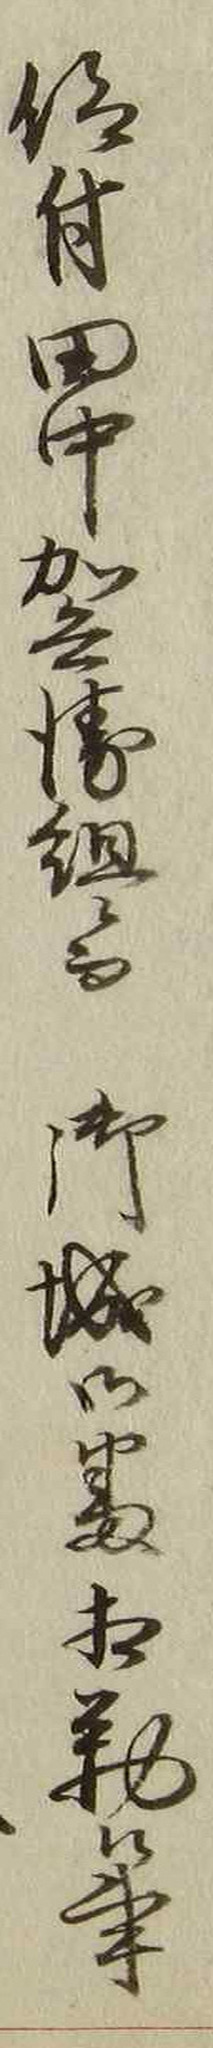仰付田中加兵衛組ニ而御城御番相勤候事
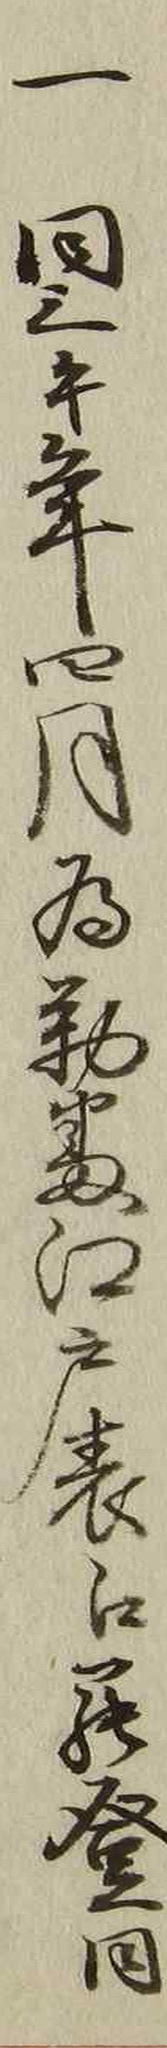一同三午年四月為勤番江戸表江罷登同
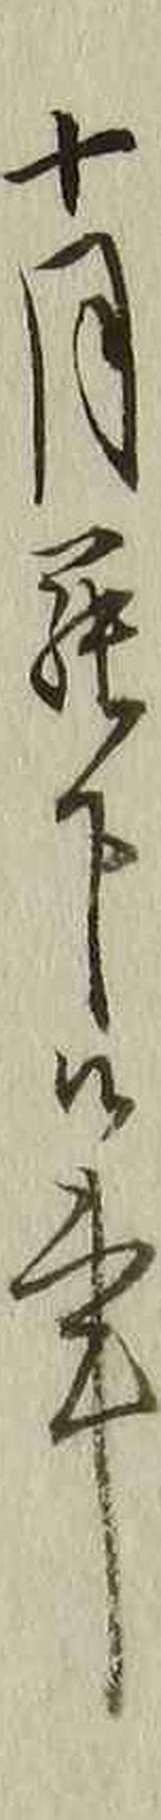十月罷下候事
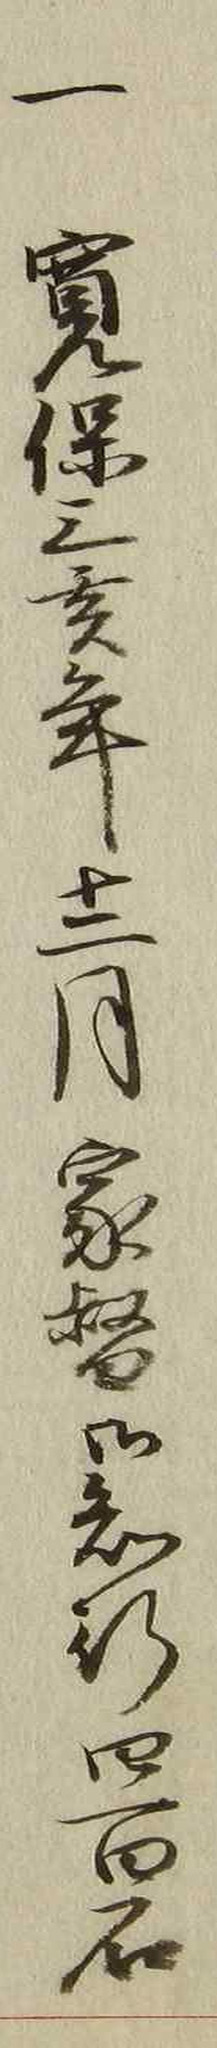一寛保三亥年十二月家督御知行四百石
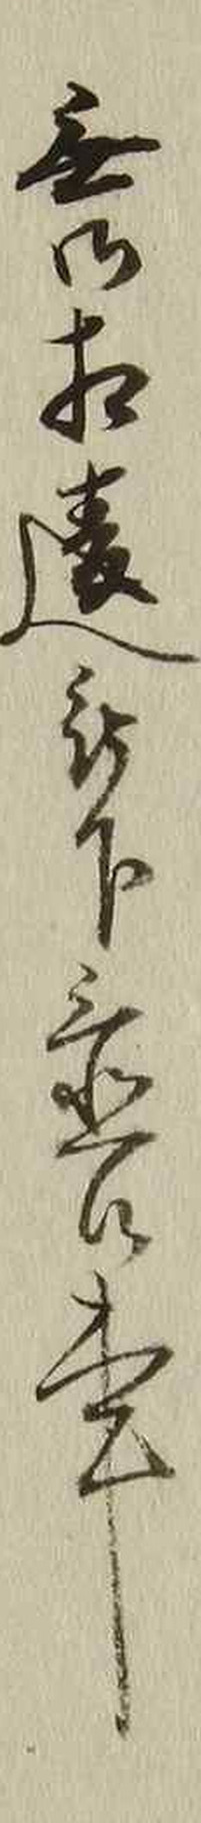無御相違被下置候事
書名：諸士系譜　巻之114　か之部22
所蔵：会津若松市立会津図書館
